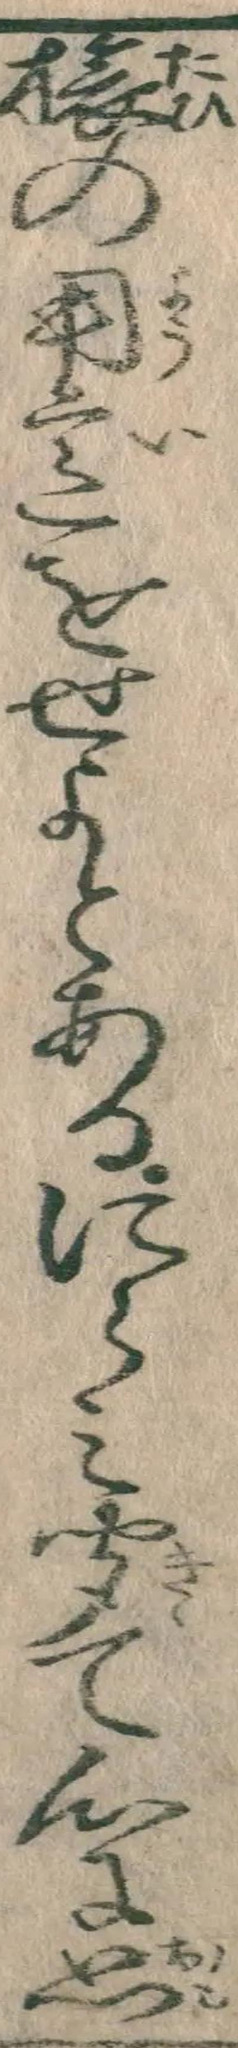旅の用意をせよとある、にらみ聞て心に思
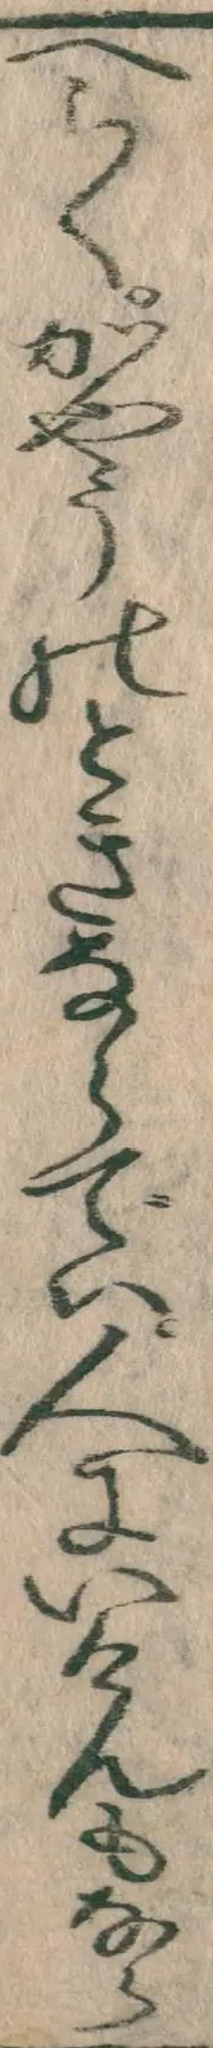へらく。かやうのときならでは。人にいけんもなら
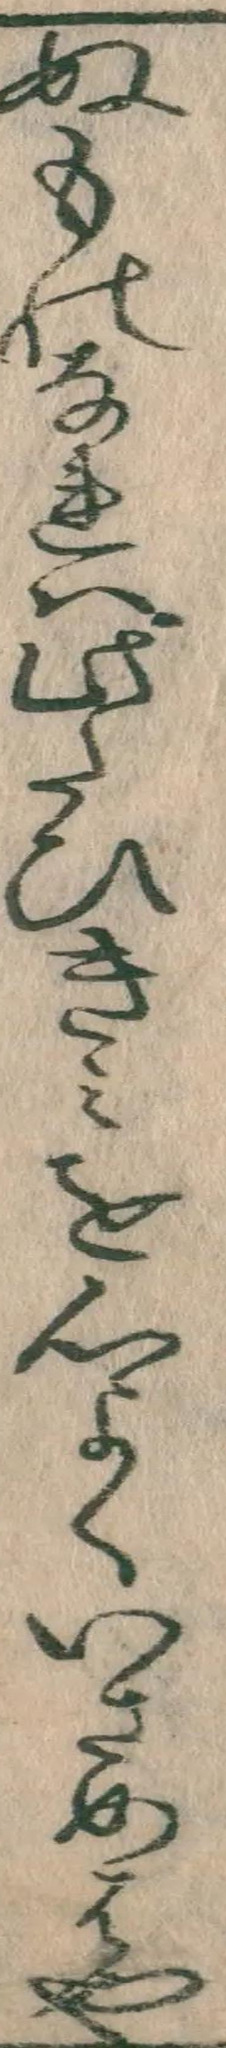ぬものなれは、此たひきみを心よくいさめはや
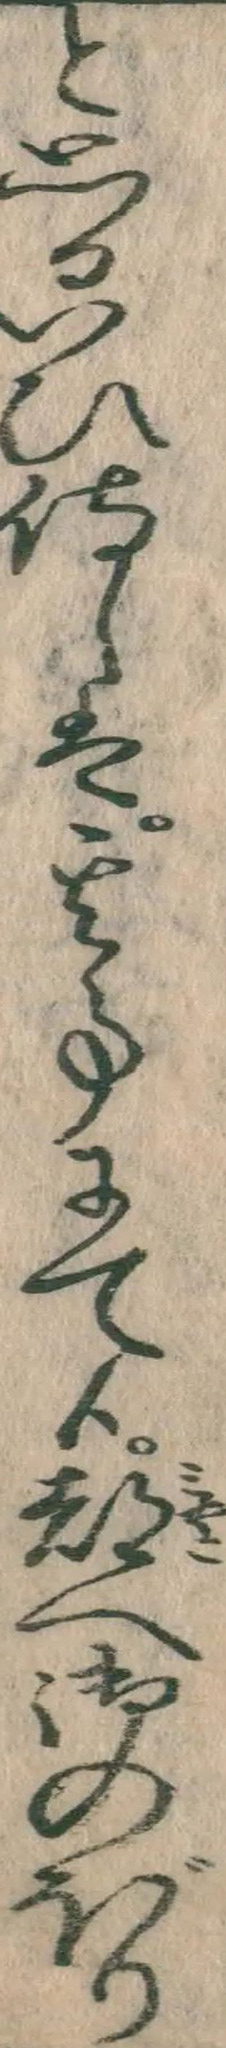と思ひいひ侍しは。其事にて候。都へ御のぼり
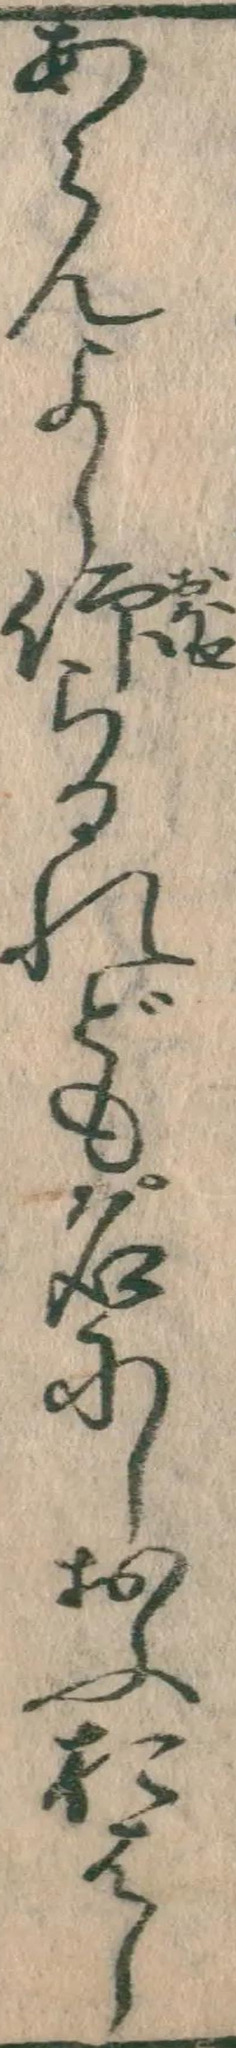あらんよし仰らるれども。名にしおふおはし
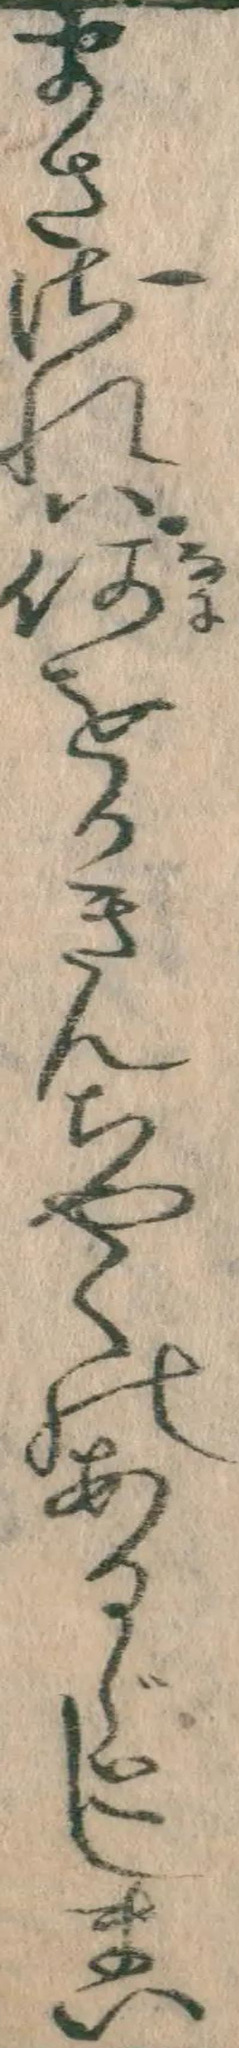まさされは何をかきんちやくのあるじとしまい
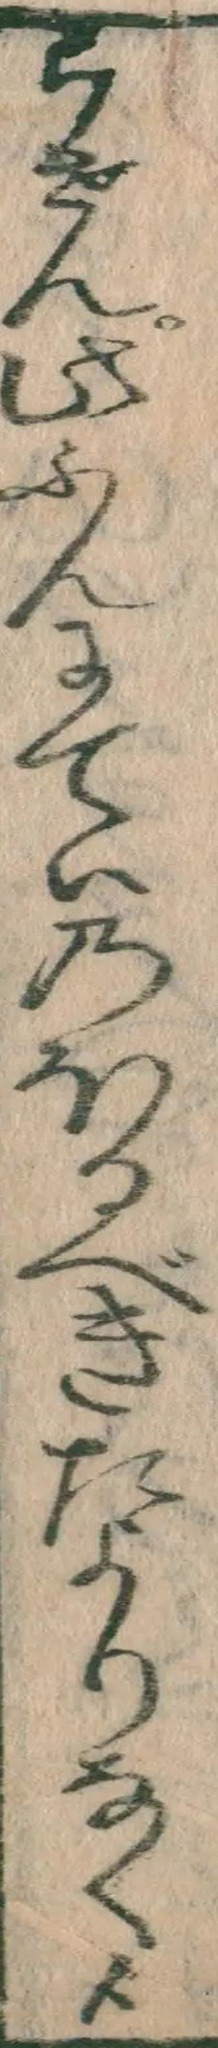らせん。此ふんにてはのほるべきたよりなく候
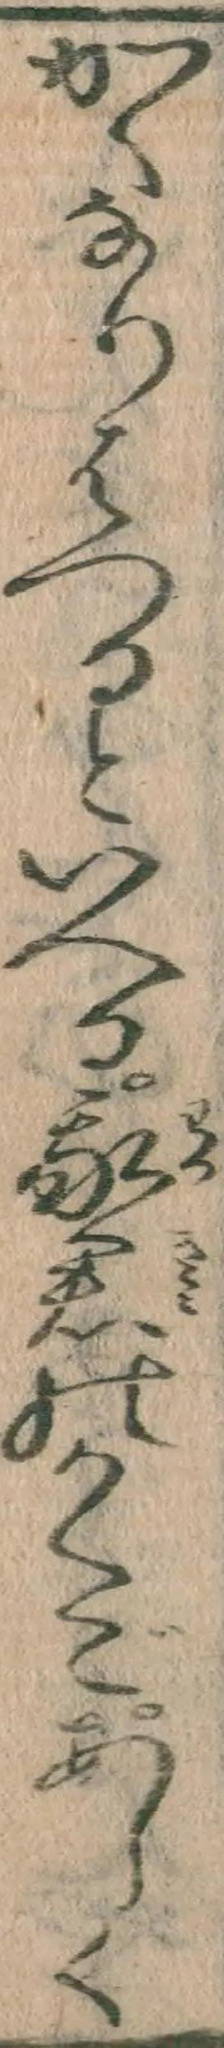かくなりはつるといへる。我君のかくご。あしく
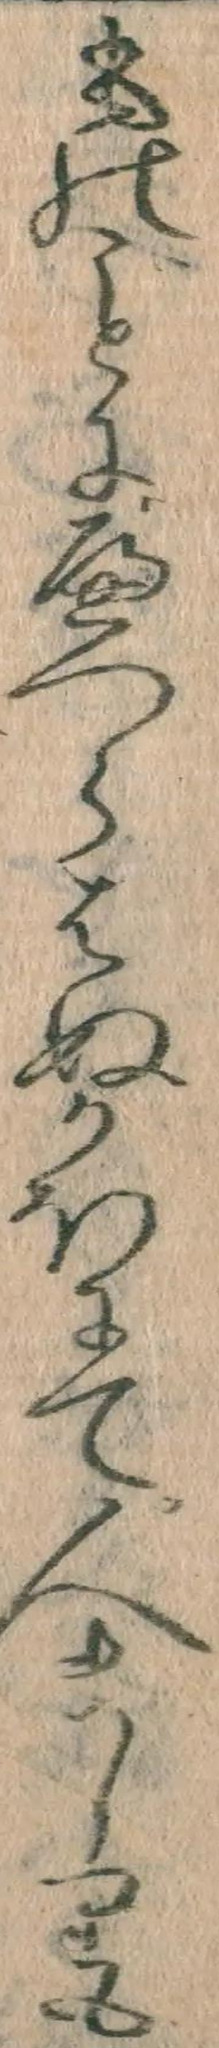ものことに。へつらはぬかほにて。人ましりも
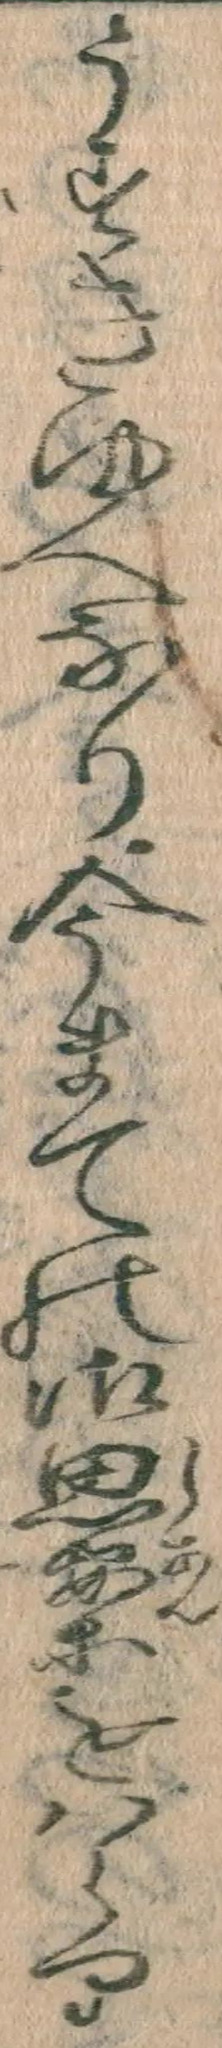うすきゆへなり、今まての御思案をはらり
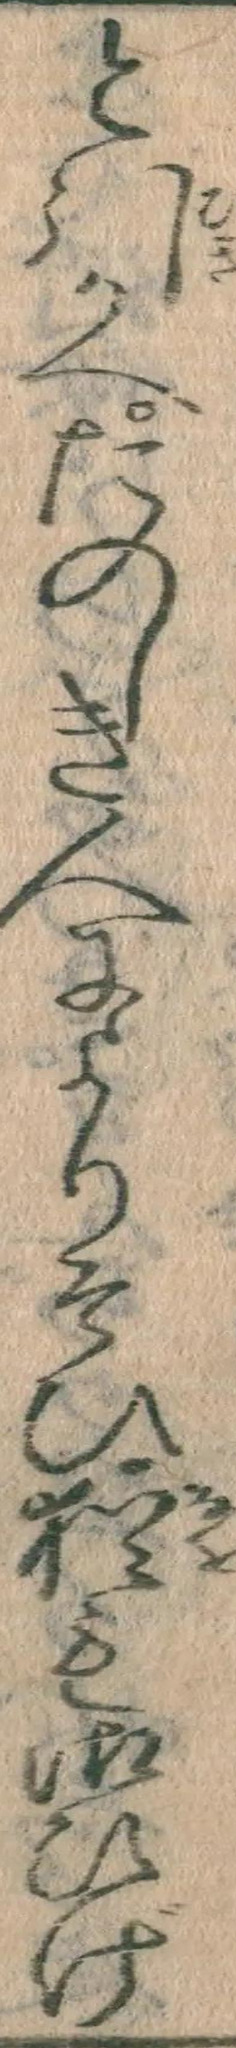と引かへ。たのしき人によりそひ、猶も御ひげ
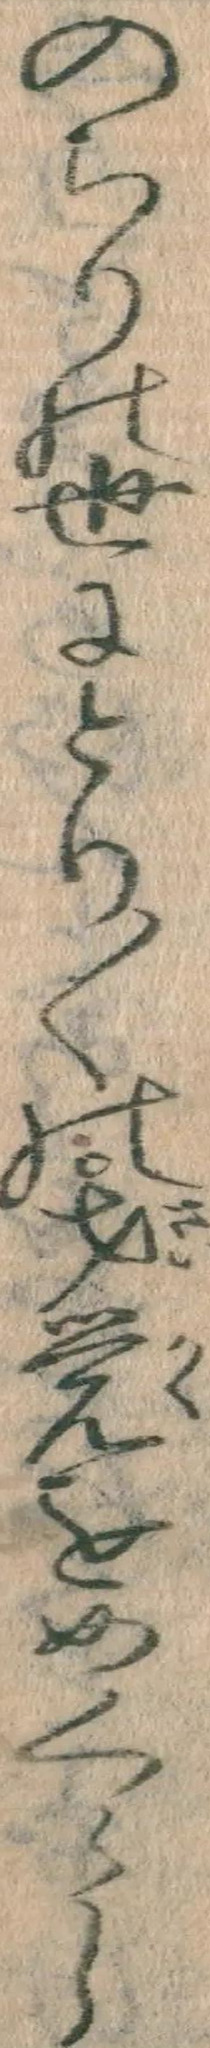のちりの世にとり〳〵の。才覚をめくらし
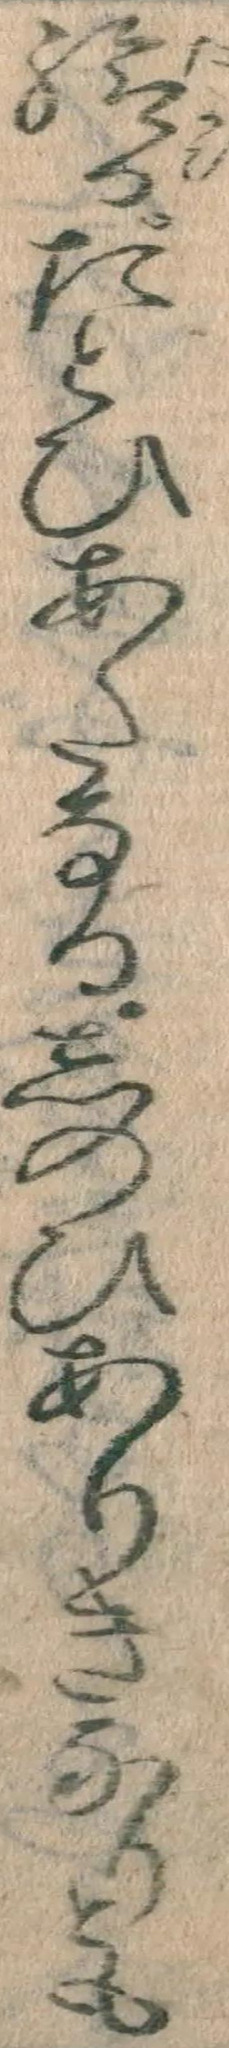給ひ。たとひあたなる、しのひありきなりとも
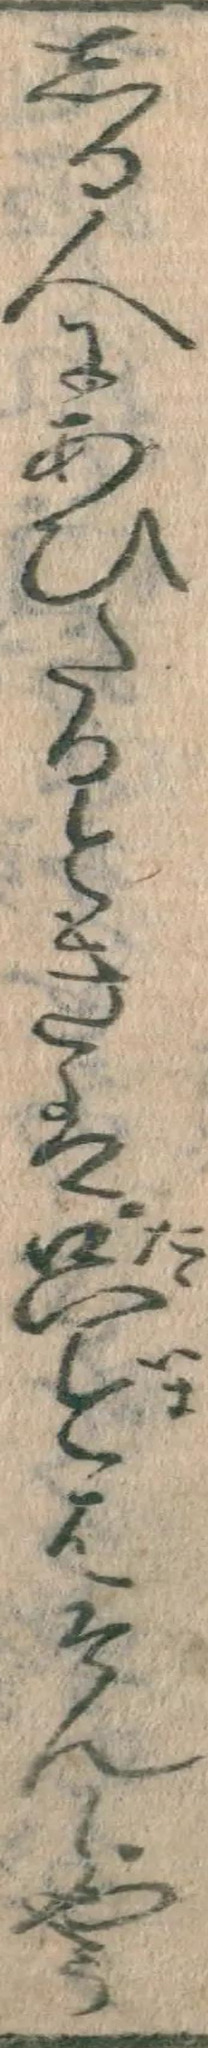しる人にあひたるときは、只今はそんしやう
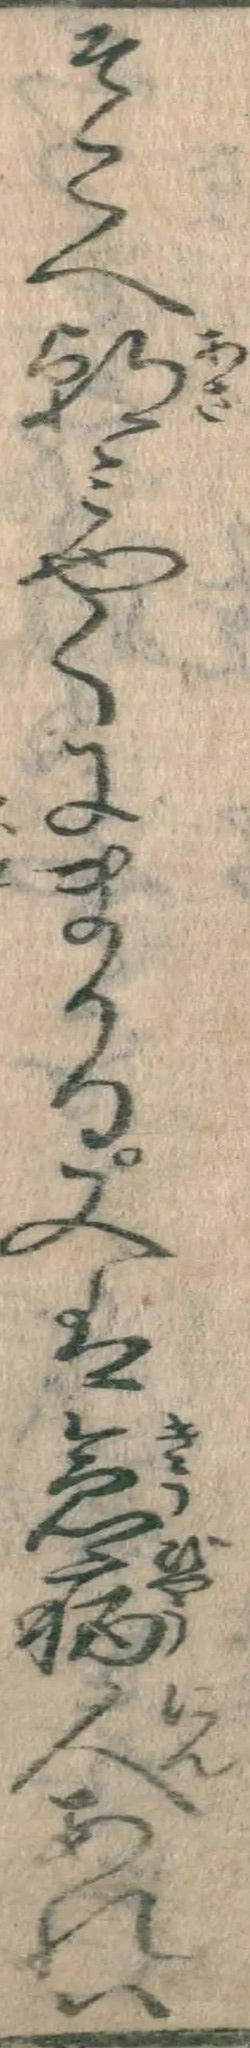そこへ朝みやくにまかる。又は急病人あれは
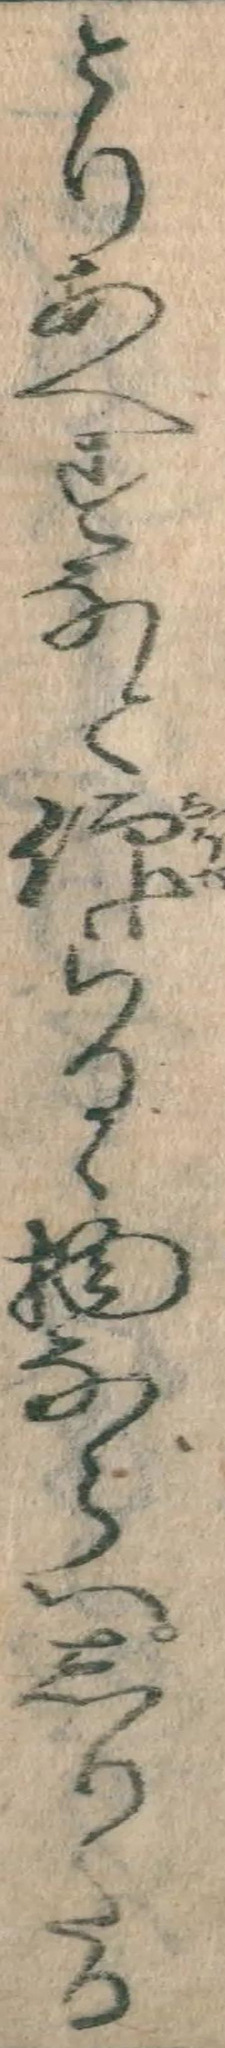とりあへすなと仰らるゝ物ならは。しりたる
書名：竹斎狂歌物語 3巻
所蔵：国立国会図書館 National Diet Library, JAPAN
